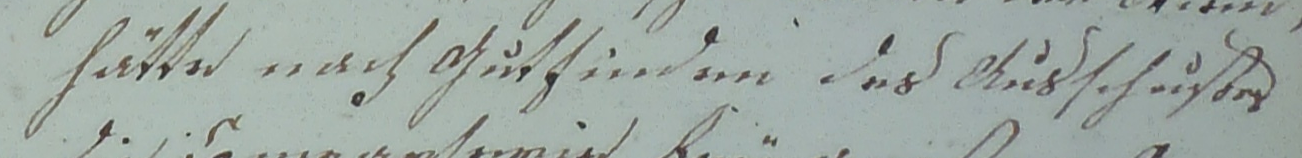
hätte nach Gutfinden des Ausschußes
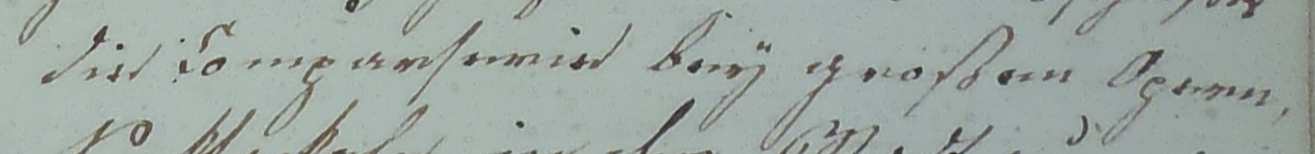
die Comparserie bey großen Opern,
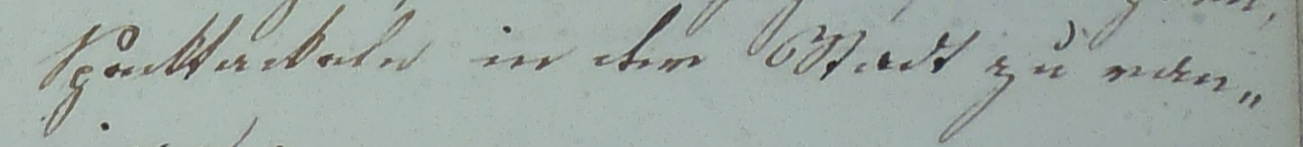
Spektackeln in der Stadt zu ran¬
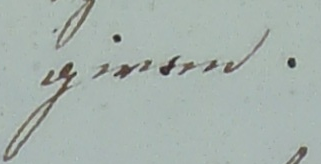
giren.
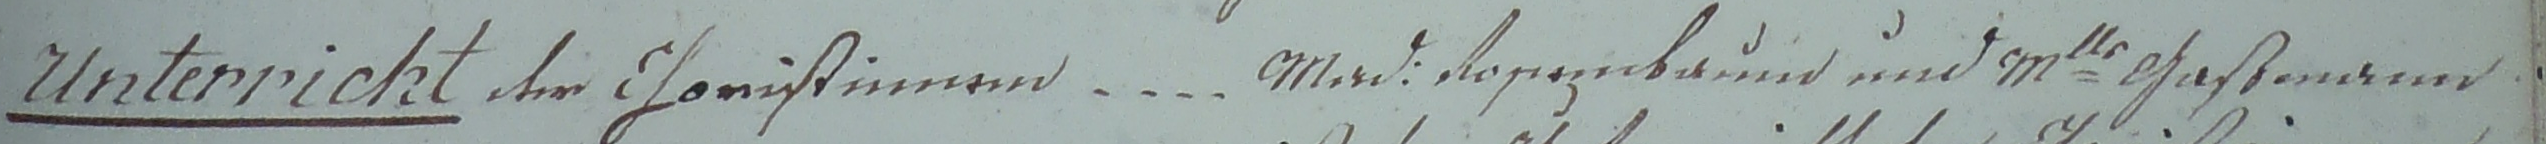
Unterricht der Choristinnen …. Mad: Rosenbaum und Mlle Gaßmann
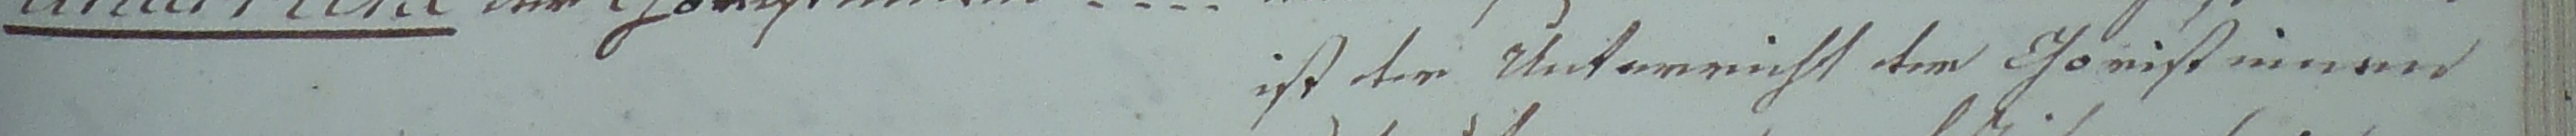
ist der Unterricht der Choristinnen
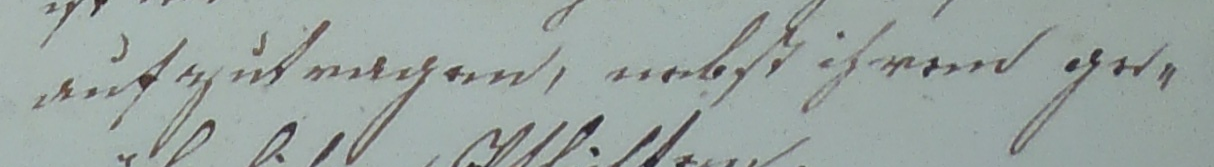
aufzutragen, nebst ihren ge¬
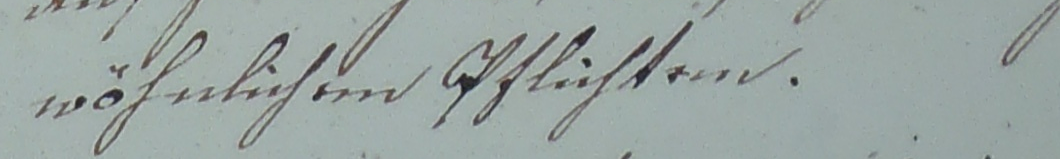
wöhnlichen Pflichten.
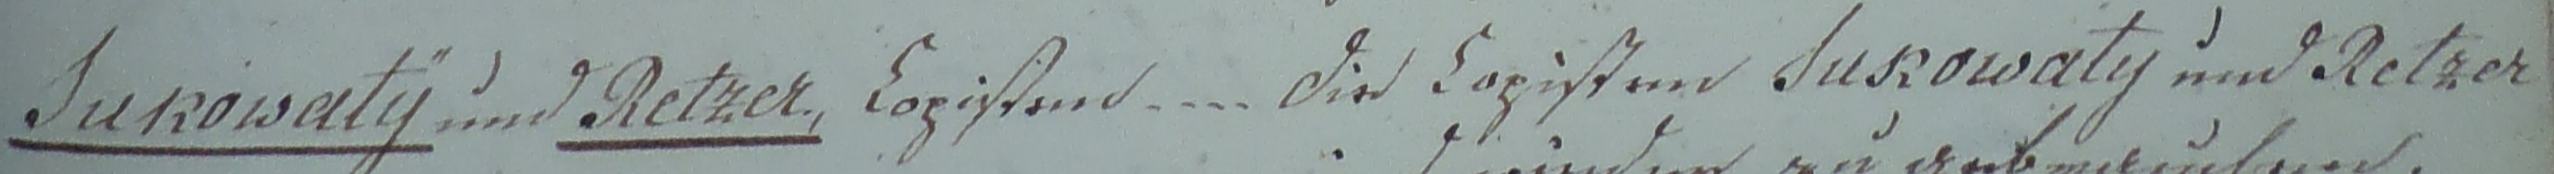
Sukowaty und Retzer, Copisten …. Die Copisten Sukowaty und Retzer
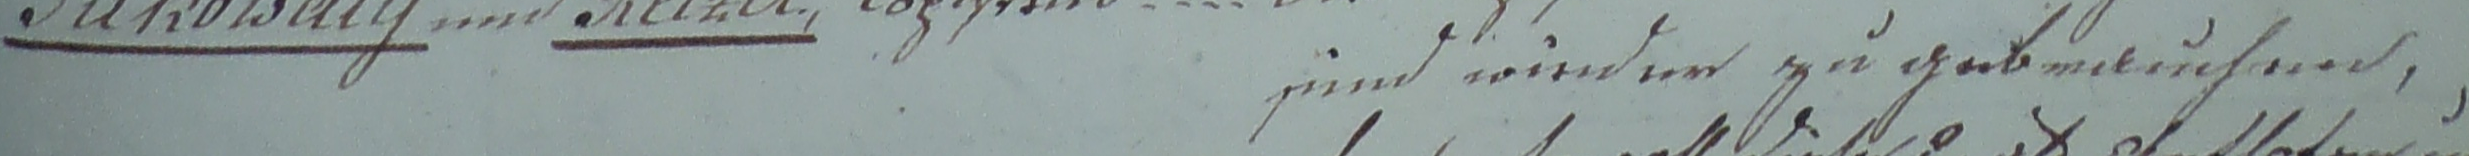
sind wieder zu gebrauchen,
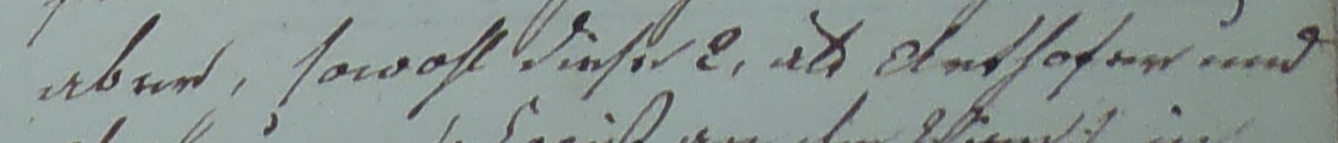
aber, sowohl diese & als Arthofer und
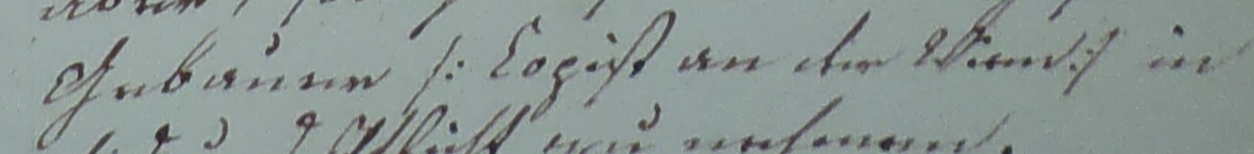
Gebauer |: Copist an der Wien :| in
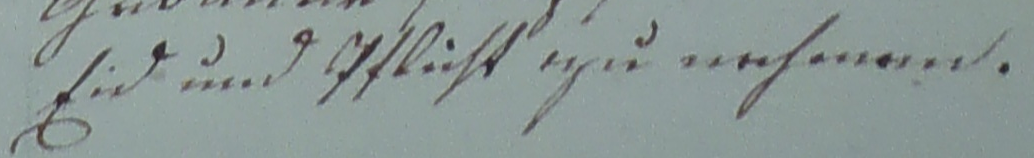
Eid und Pflicht zu nehmen.
